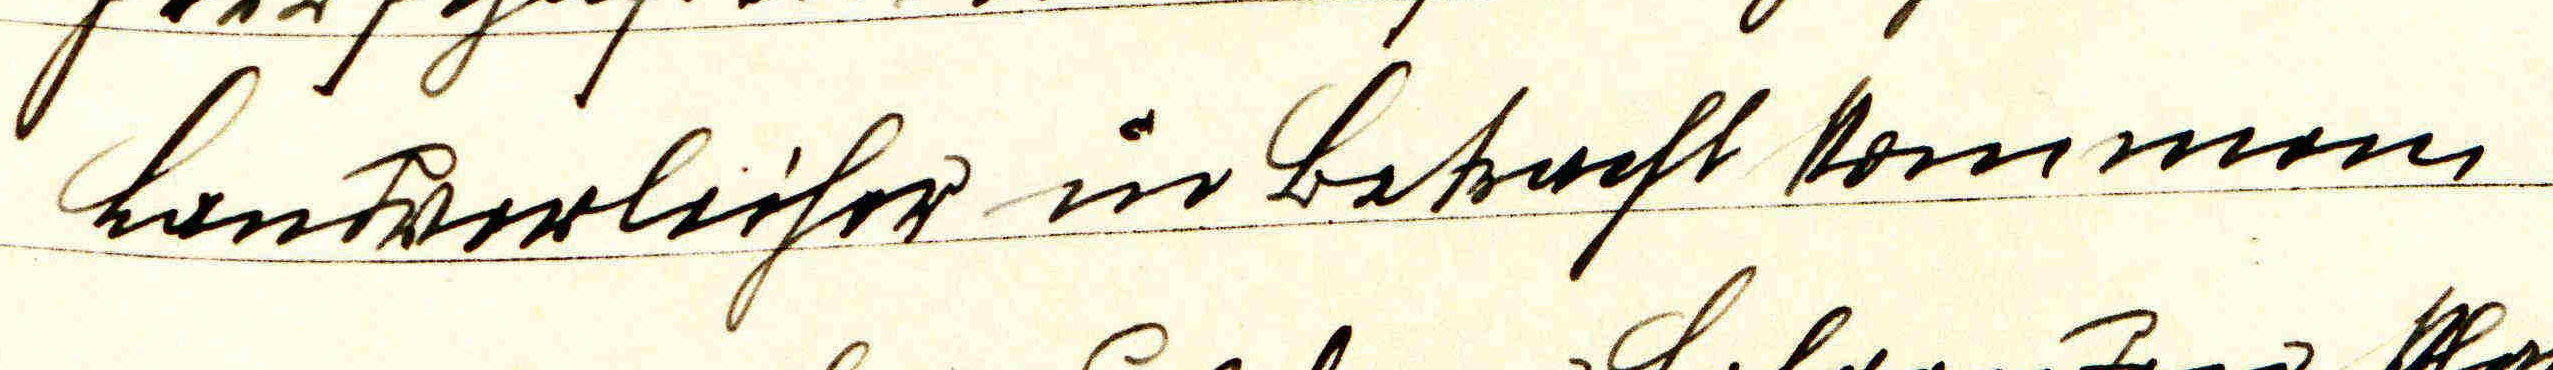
Landverleiher in Betracht kommen
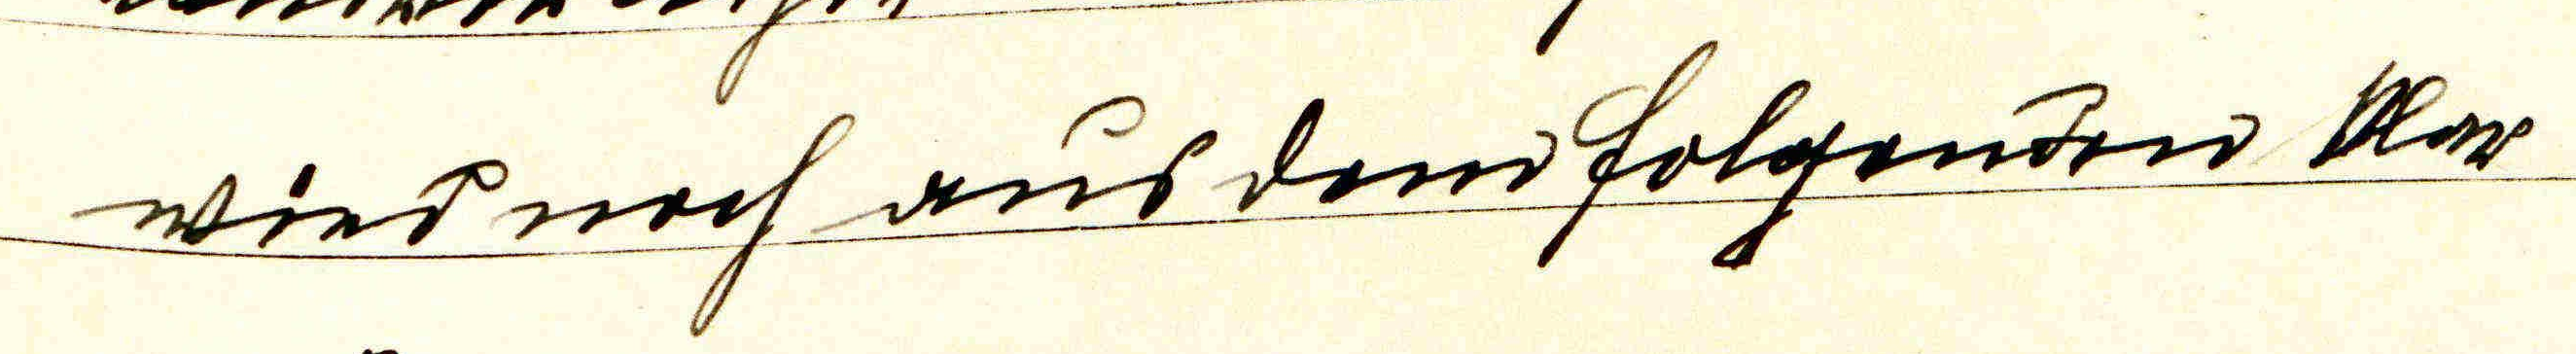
wird noch aus dem folgenden klar
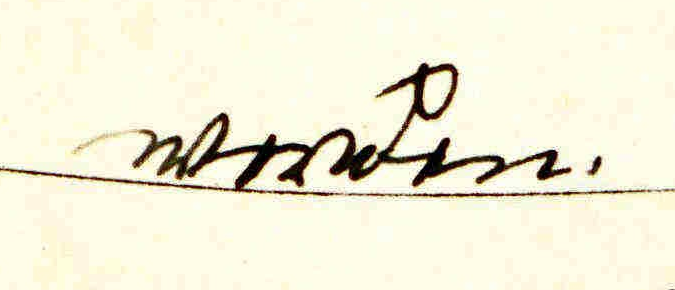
werden.
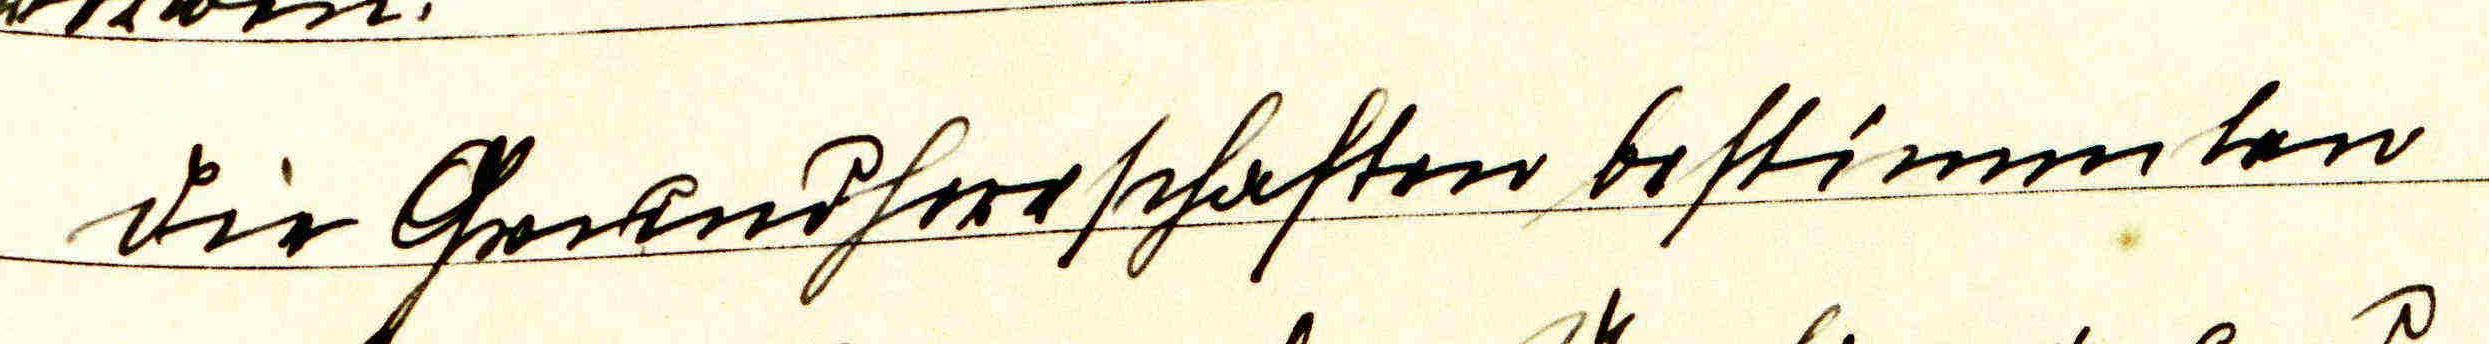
Die Grundherrschaften bestimmten
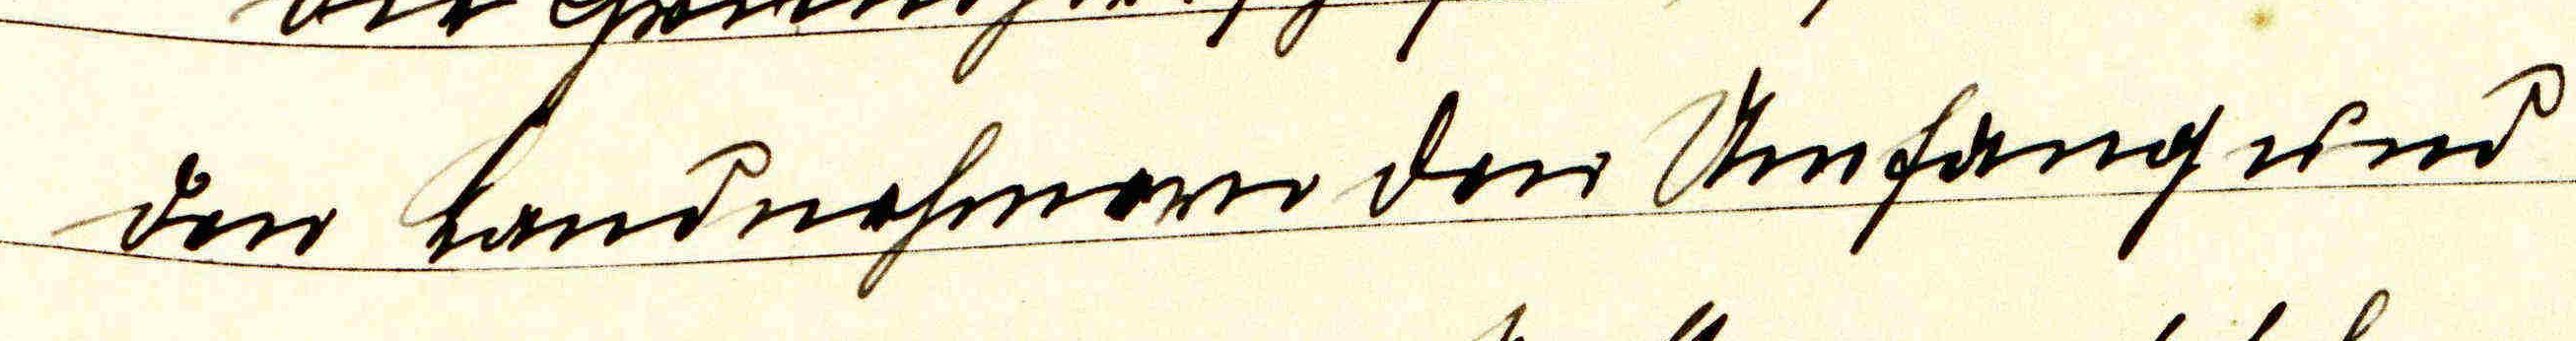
den Landnehmern den Umfang und
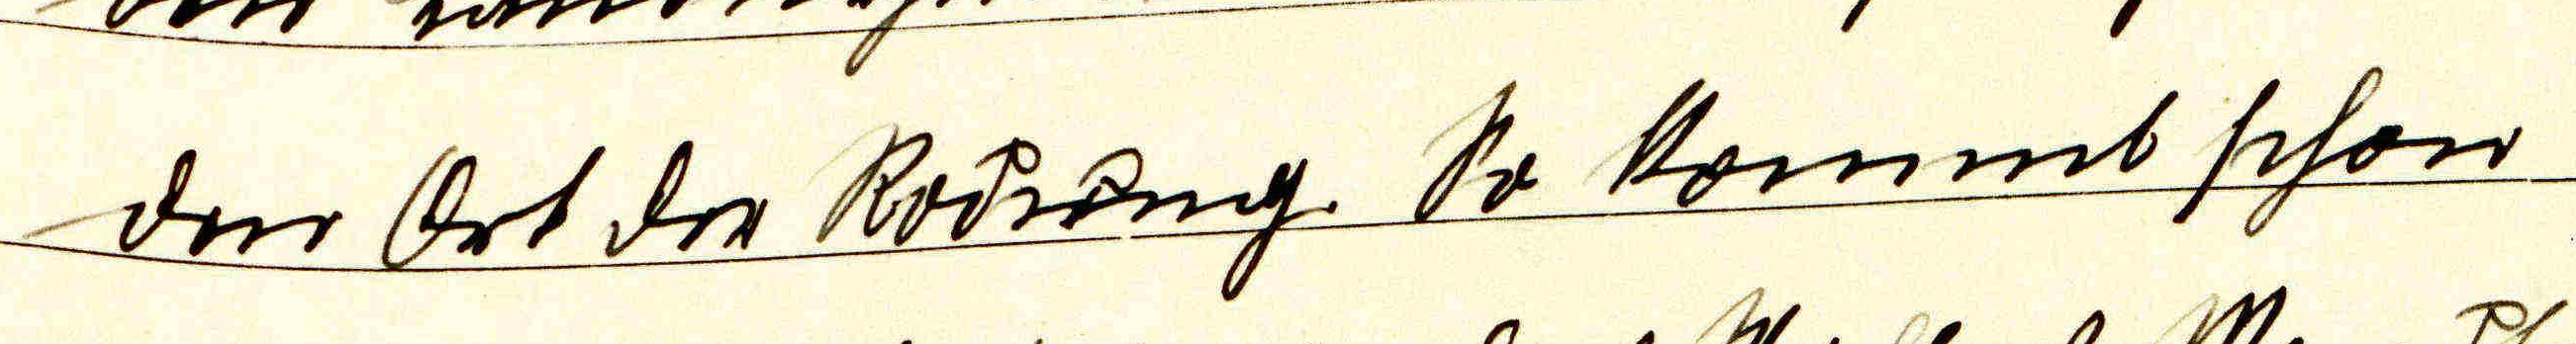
den Ort der Rodung. So kommt schon
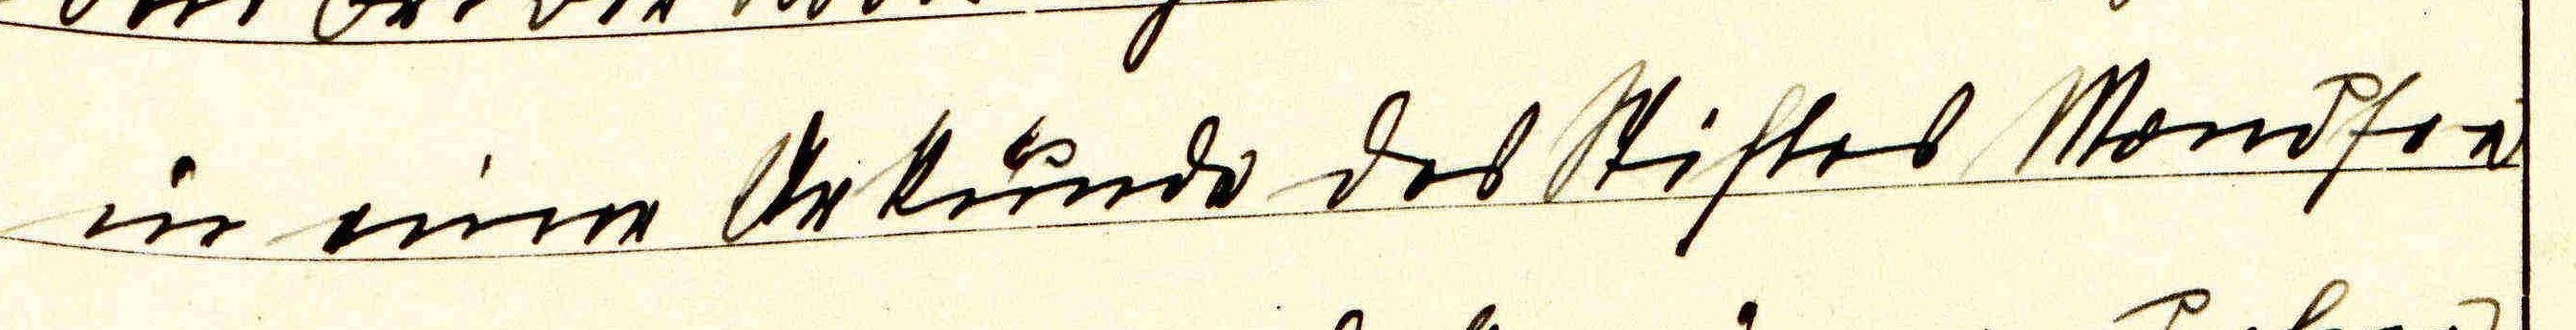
in einer Urkunde des Stiftes Mondsee
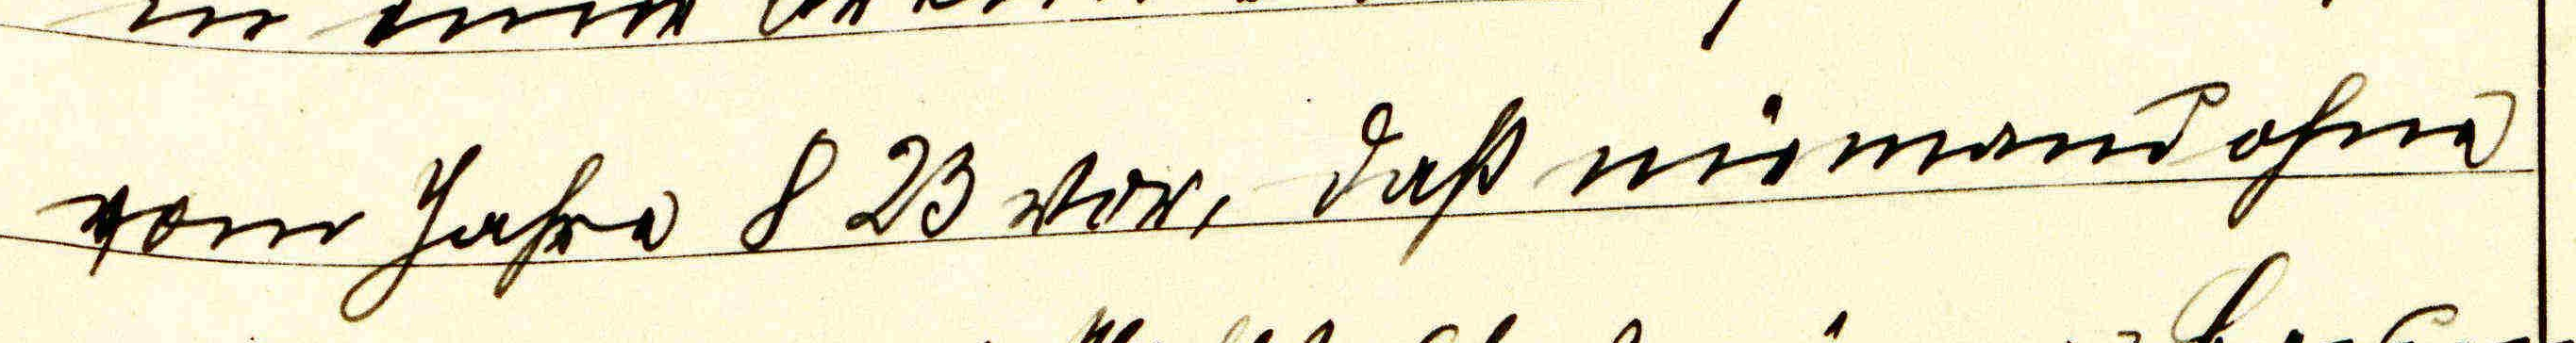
vom Jahre 823 vor, daß niemand ohne
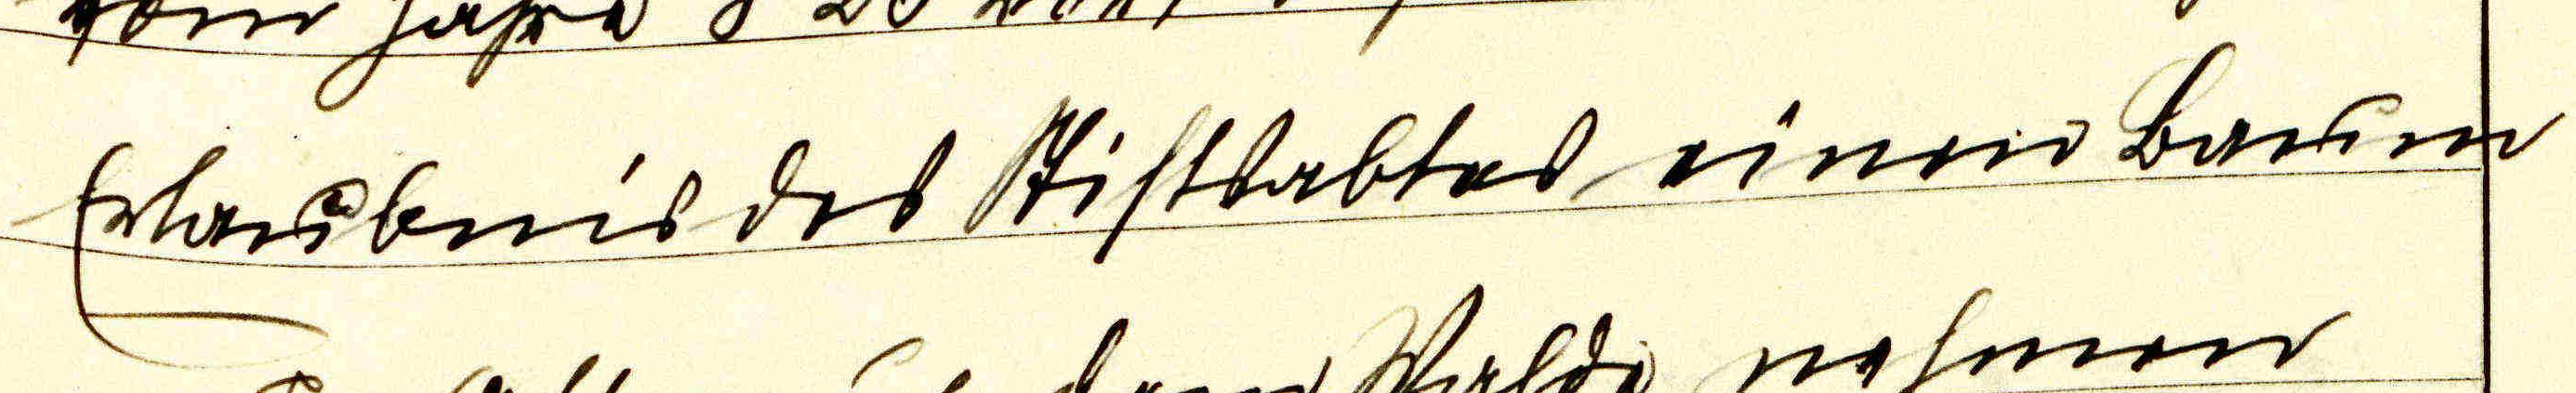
Erlaubnis des Stiftsabtes einen Baum
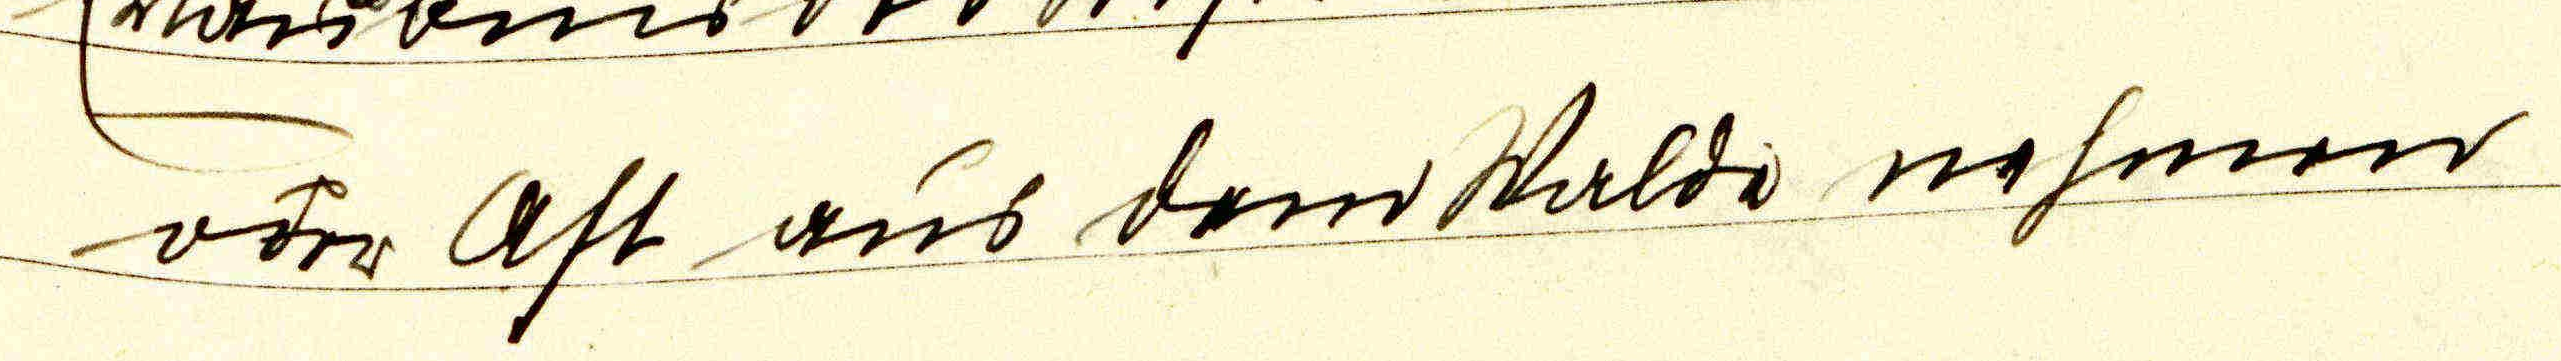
oder Ast aus dem Walde nehmen
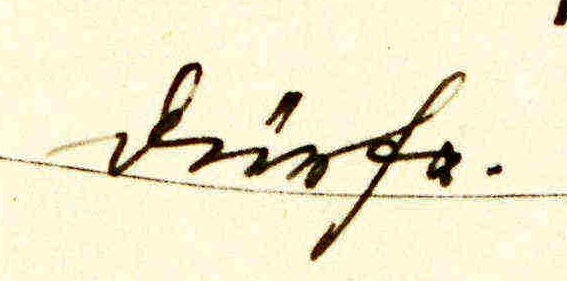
dürfe.
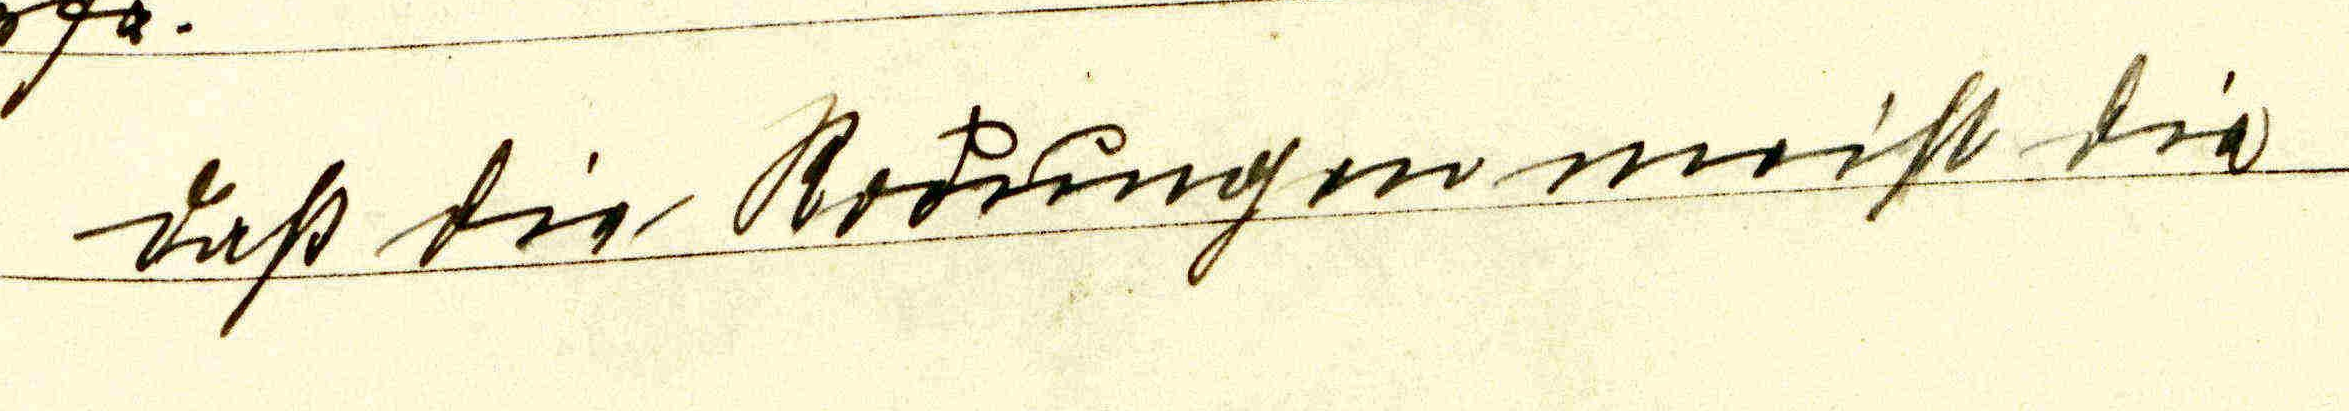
Daß die Rodungen meist die
